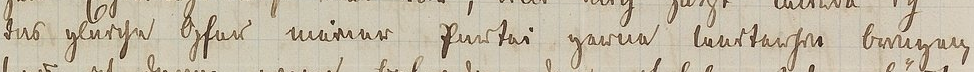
das gleiche Opfer meiner Partei gerne weiterhin bringen,
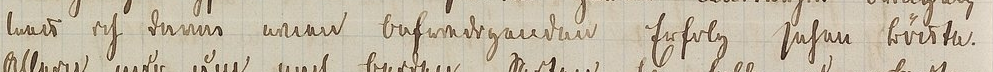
wenn ich davon einen befriedigenden Erfolg sehen könnte.
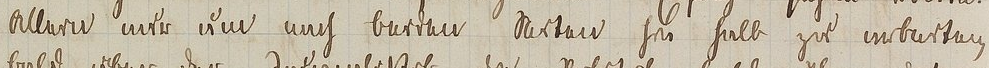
Allein nur um nach beiden Seiten hin halb zu arbeiten,
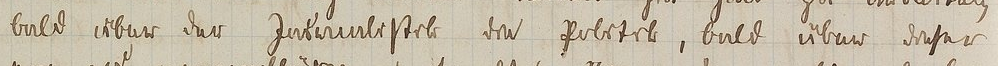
bald über der Journalistik die Politik, bald über dieser
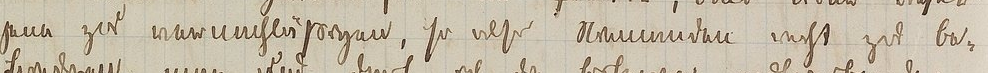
jene zu vernachläßigen, so also Niemanden recht zu be-
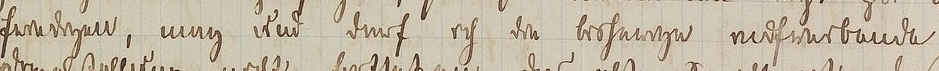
friedigen, mag und darf ich die bisherige aufreibende
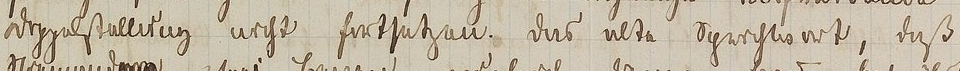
Doppelstellung nicht fortsetzen. Das alte Sprichwort, daß
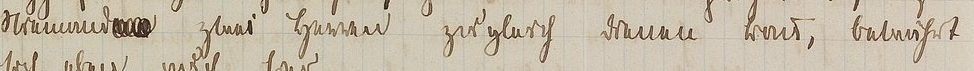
Niemanden zwei Herren zugleich dienen kann, bewährt
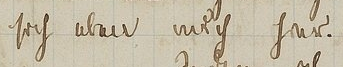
sich eben auch hier.
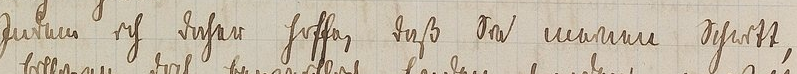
Indem ich daher hoffe, daß Sie meinen Schritt,
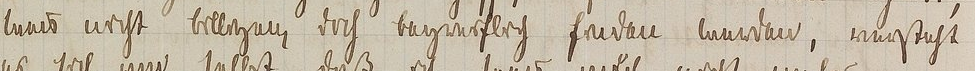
wenn nicht billigen, doch begreiflich finden werden, versteht
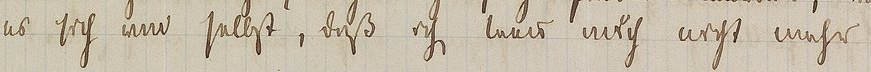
es sich von selbst, daß ich wenn auch nicht mehr
